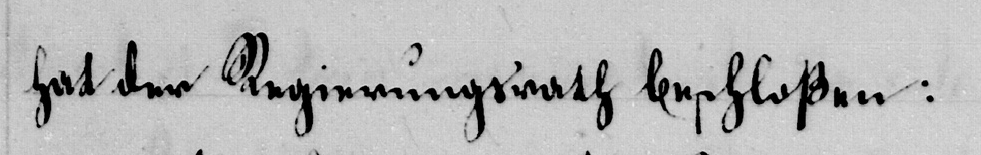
hat der Regierungsrath beschloßen:
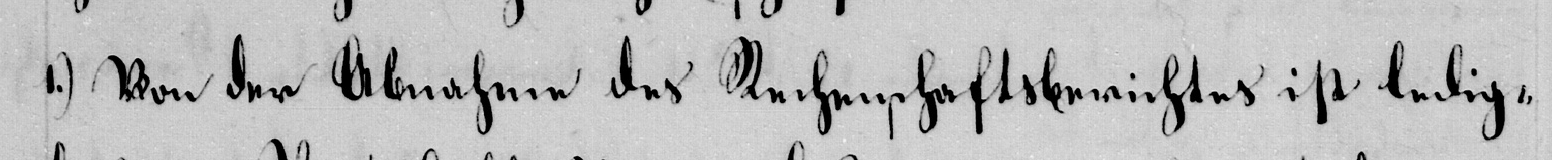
1.) Von der Abnahme des Rechenschaftsberichtes ist ledig¬
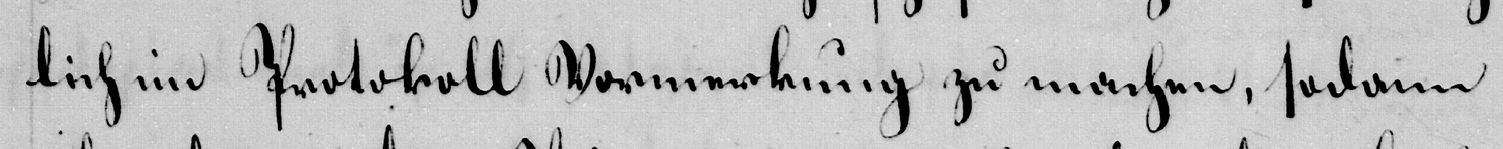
lich im Protokoll Vormerkung zu machen, sodann
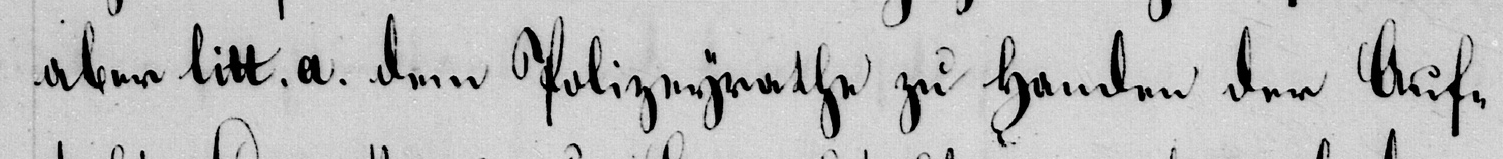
aber litt. a. dem Polizeyrathe zu Handen der Auf¬
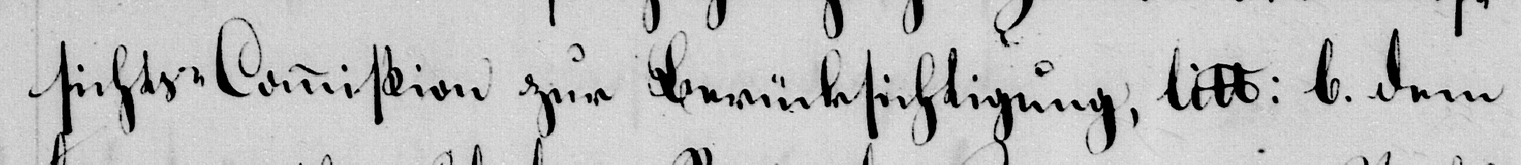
sichts-Commißion zur Berücksichtigung, litt: b. dem
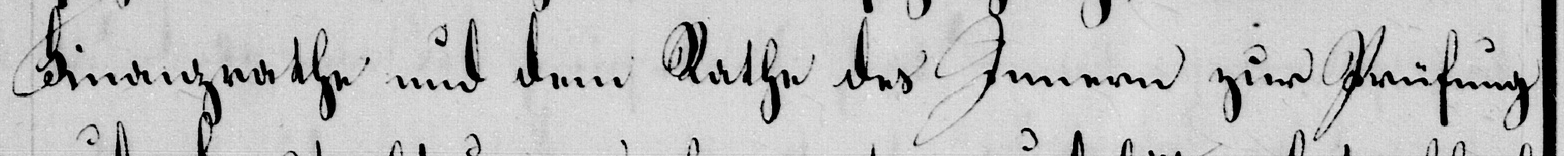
Finanzrathe und dem Rathe des Innern zur Prüfung
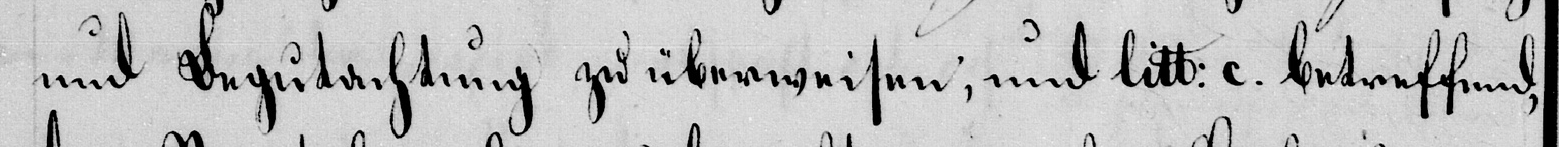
und Begutachtung zu überweisen, und litt: c. betreffend,
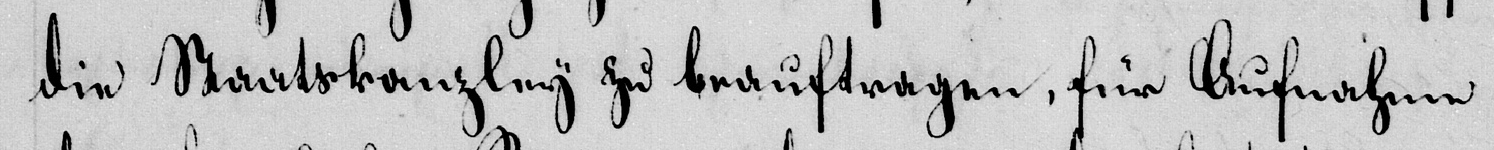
die Staatskanzley zu beauftragen, für Aufnahme
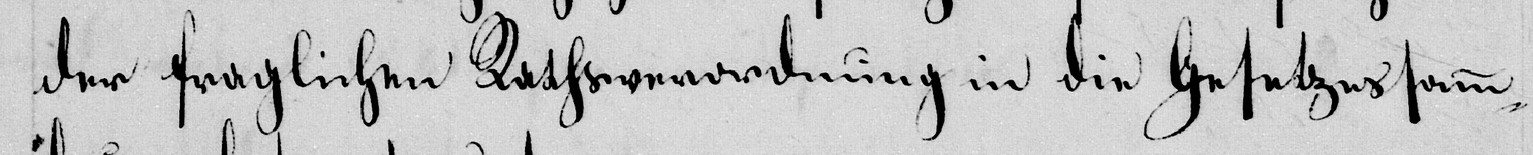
der fraglichen Rathsverordnung in die Gesetzessamm¬
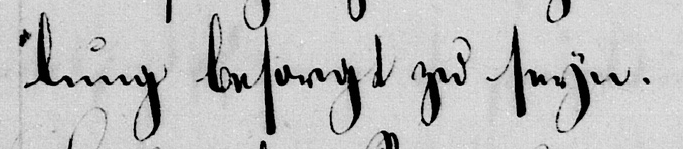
lung besorgt zu seyn.
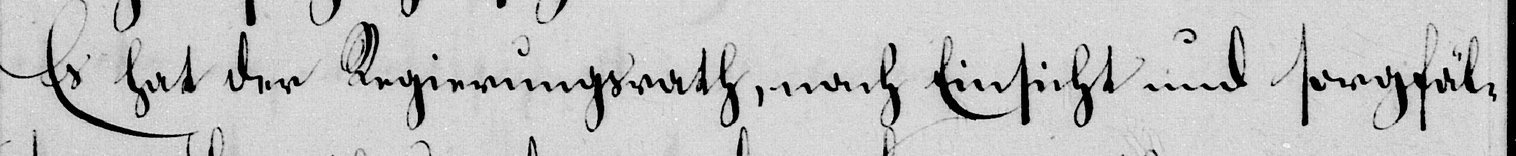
Es hat der Regierungsrath, nach Einsicht und sorgfäl¬
